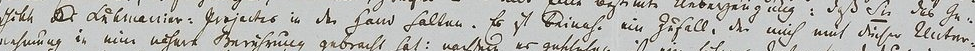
schikk des Lukmanier-Projectes in der Hand halten. Es ist beinahe ein Zufall, der mich mit dieser Unter-
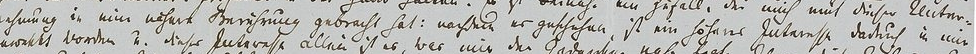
nehmung in eine nähere Berührung gebracht hat: nachdem es geschehen, ist ein höheres Intereresse dadurch in mir
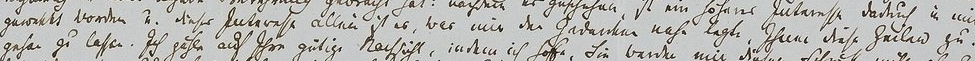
gewekkt worden u. dieses Interesse allein ist es, was mir den Gedanken nahe legte, Ihnen diese Zeilen zu-
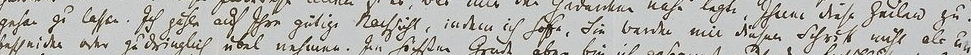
gehen zu lassen. Ich zähle auf Ihre gütige Nachsicht, indem ich hoffe, Sie werden mir diesen Schritt nicht als un-
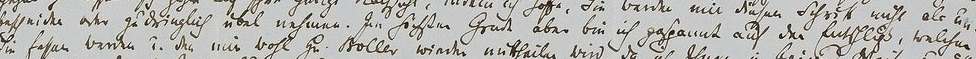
bescheiden oder zudringlich übel nehmen. Im höchsten Grad aber bin ich gespannt auf den Entschluß, welchen
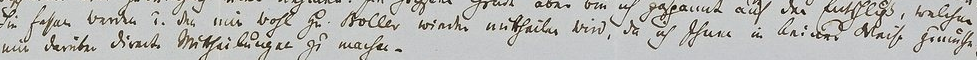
Sie fassen werden u. den mir wohl Hr. Boller wieder mittheilen wird, da ich Ihnen in keiner Weise zumuthe,
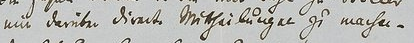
mir darüber directe Mittheilungen zu machen.
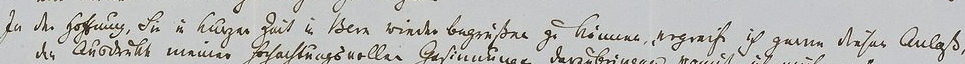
In der Hoffnung, Sie in kurzer Zeit in Bern wieder begrüßen zu können, ergreife ich gerne diesen Anlaß,
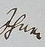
Ihnen
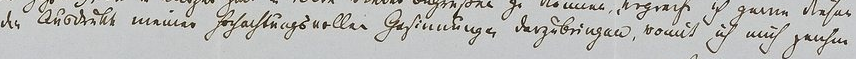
den Ausdrukk meiner hochachtungsvollen Gesinnungen darzubringen, womit ich mich zeichne
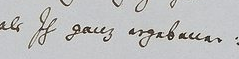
als Ihr ganz ergebener:
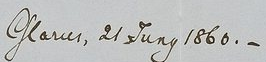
Glarus, 21. Juny 1860.
